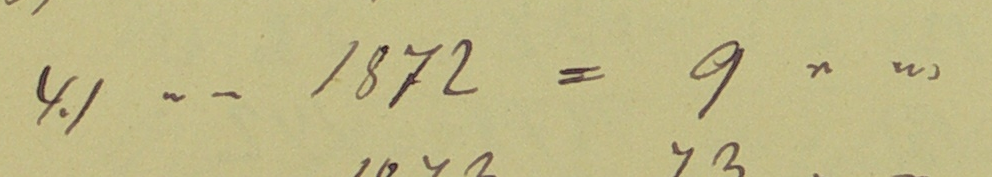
4) * 1872 = 9
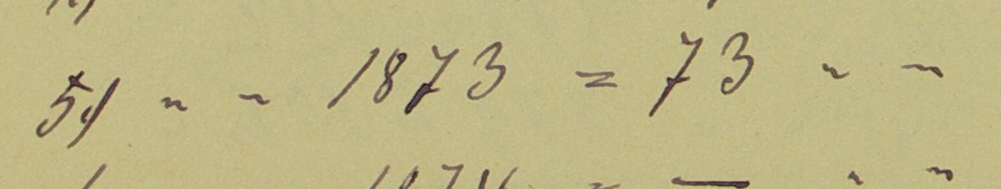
5) * 1873 = 73
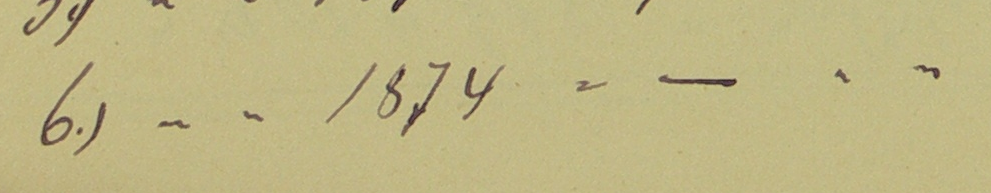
6) * 1874 = --
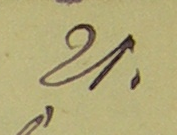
21
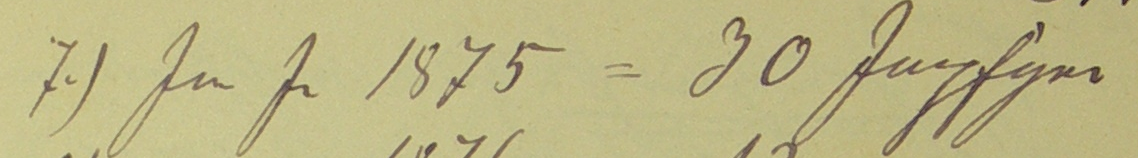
7) * 1875 = 30
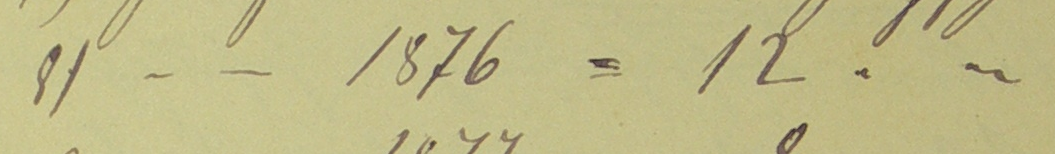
8) * 1876 = 12
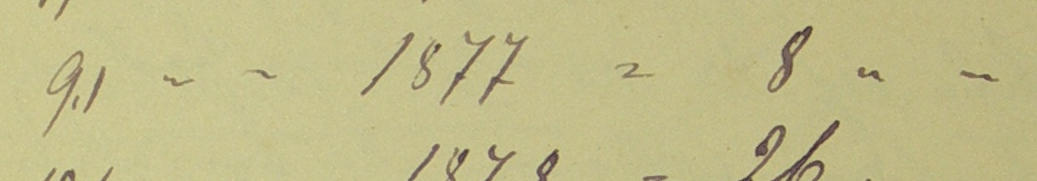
9) * 1877 = 8
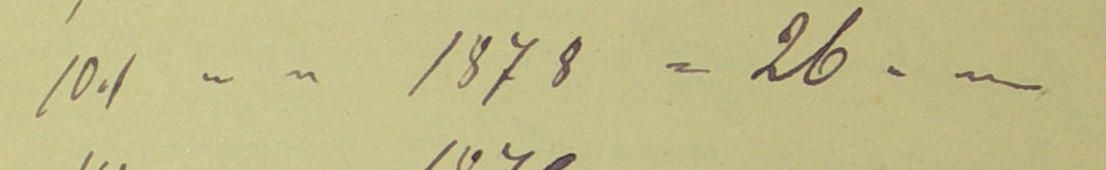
10) * 1878 = 26
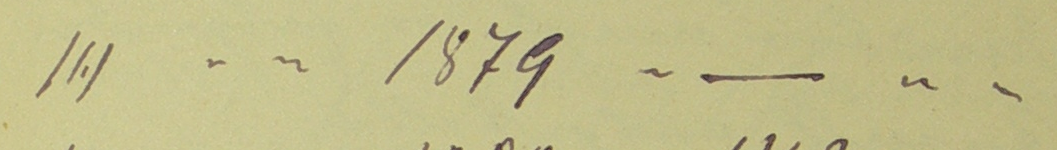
11) * 1879 = __
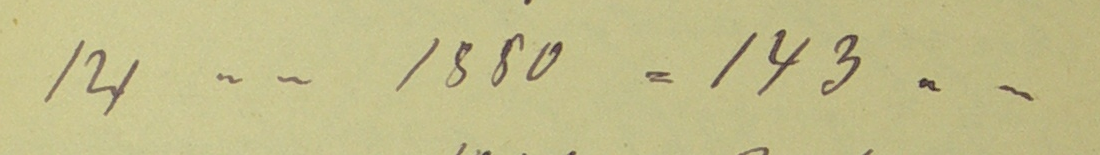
12) * 1880 = 143
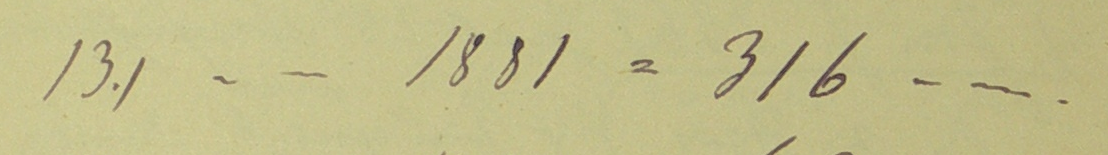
13) * 1881 = 316
